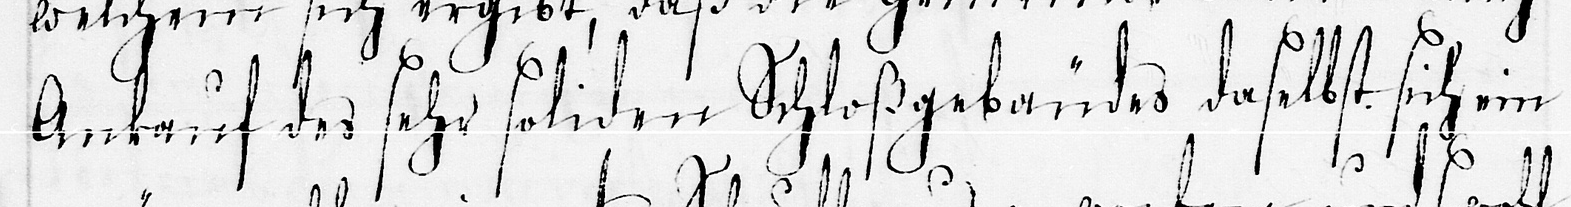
Ankauf des sehr soliden Schloßgebäudes daselbst sich e¬
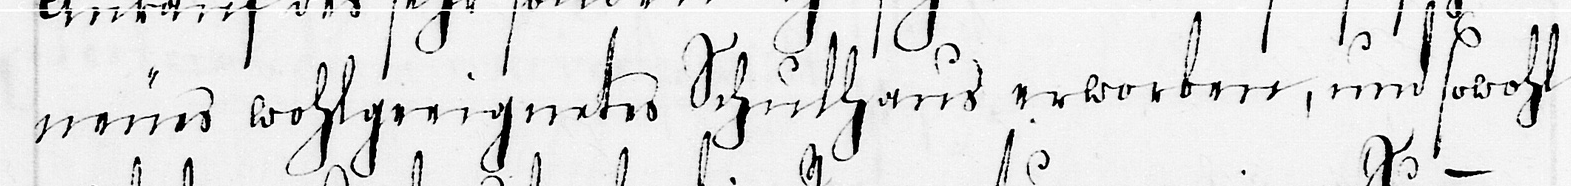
neues wohlgeeignetes Schulhaus erworben, und sowohl
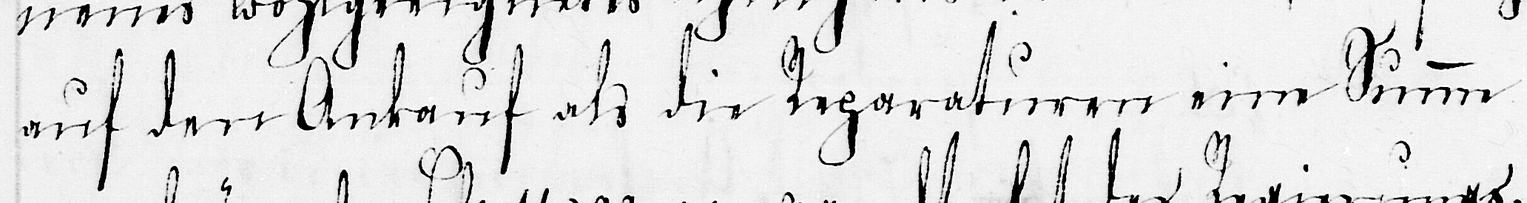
auf den Ankauf als die Reparaturen eine Summe
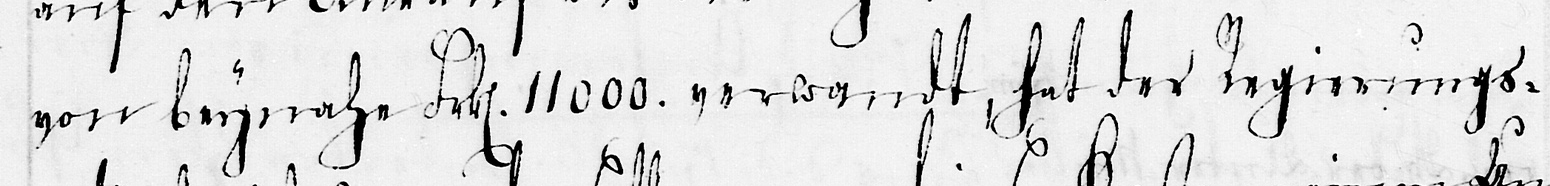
von beynahe Frk[en]. 11 000. verwandt, hat der Regierungs¬
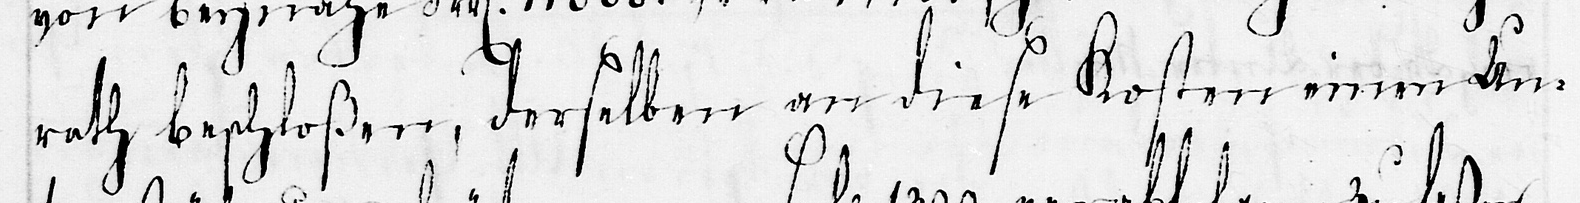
rath beschloßen, derselben an diese Kosten einen Un¬
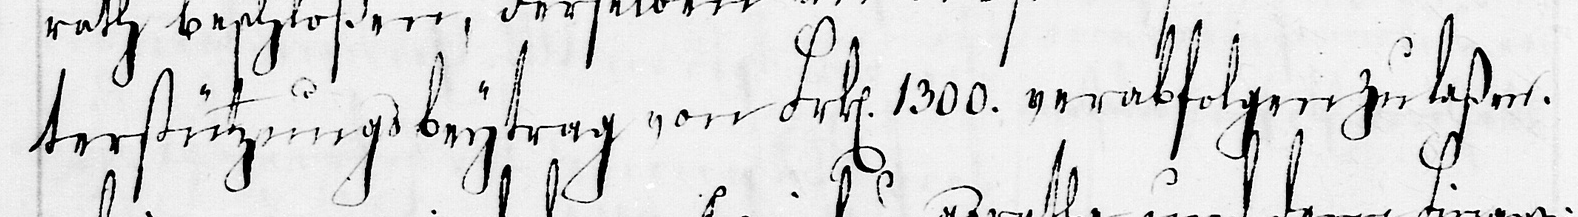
terstützungsbeytrag von Frk[en]. 1300. verabfolgen zu laßen.
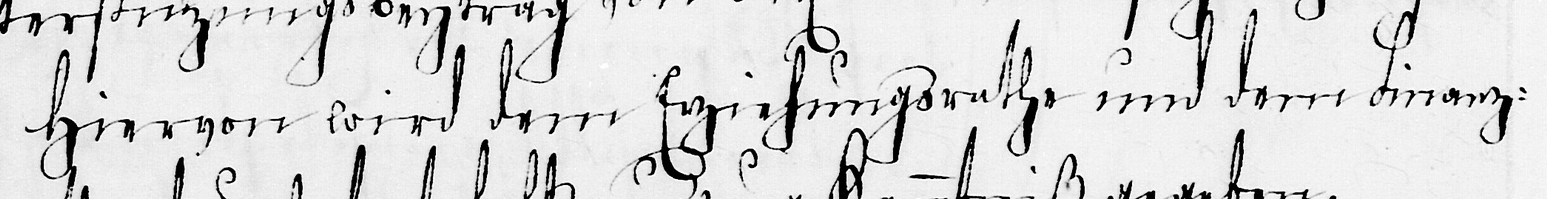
Hiervon wird dem Erziehungsrathe und dem Finanz¬
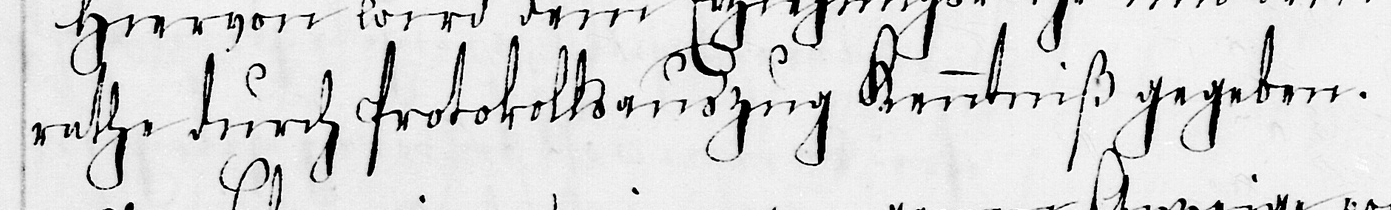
rathe durch Protokollsauszug Kenntniß gegeben.
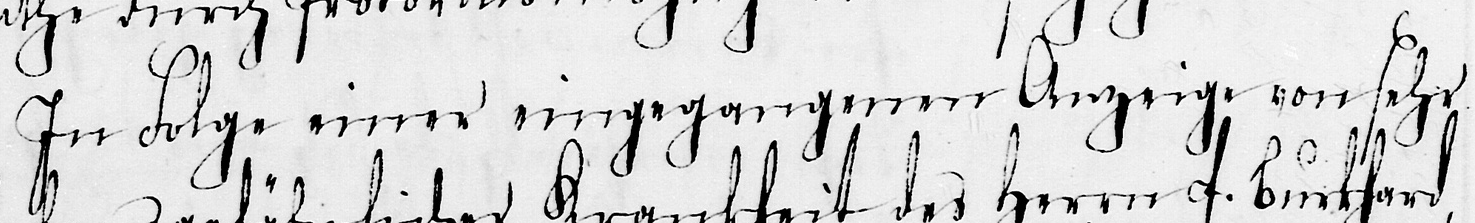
In Folge einer eingegangenen Anzeige von sehr
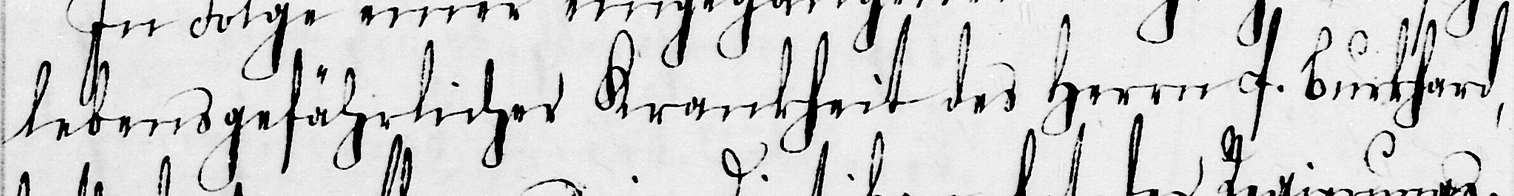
lebensgefährlicher Krankheit des Herrn P. Burkhard,
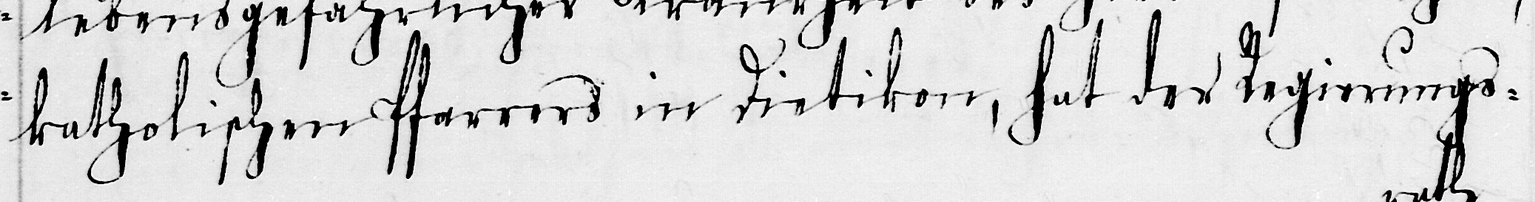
katholischen Pfarrers in Dietikon, hat der Regierungs-
